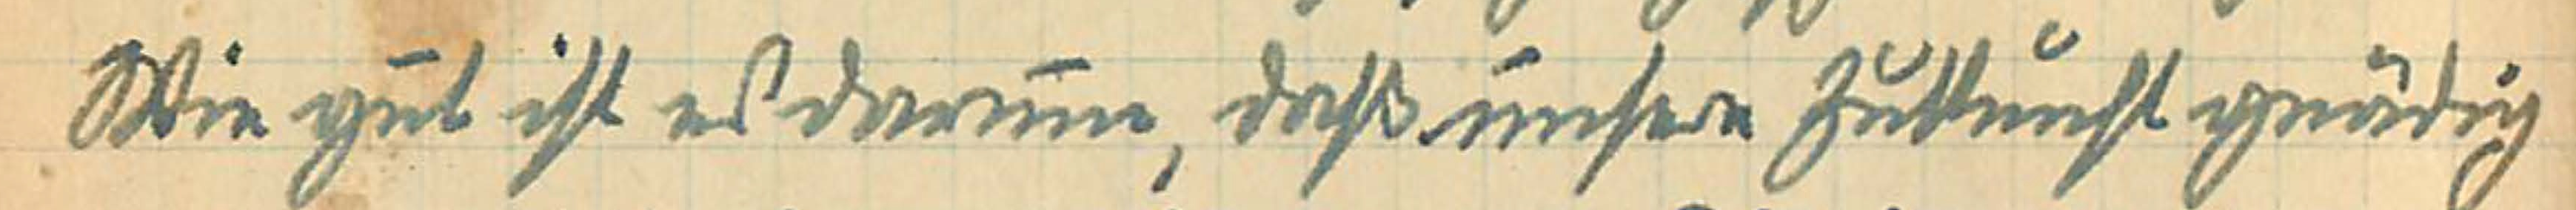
Wie gut ist es darum, daß unsere Zukunft gnädig
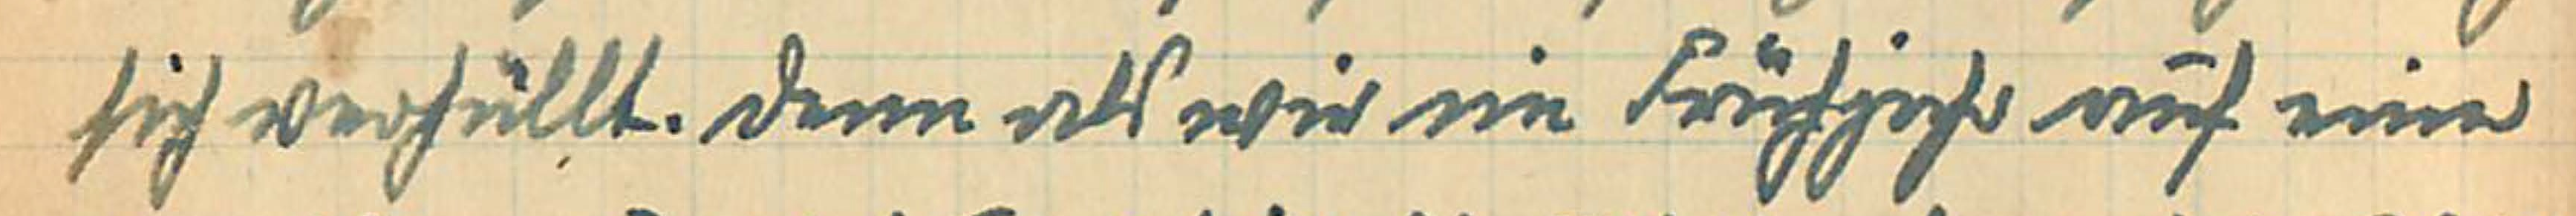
sich verhüllt. Denn als wir im Frühjahr auf einer
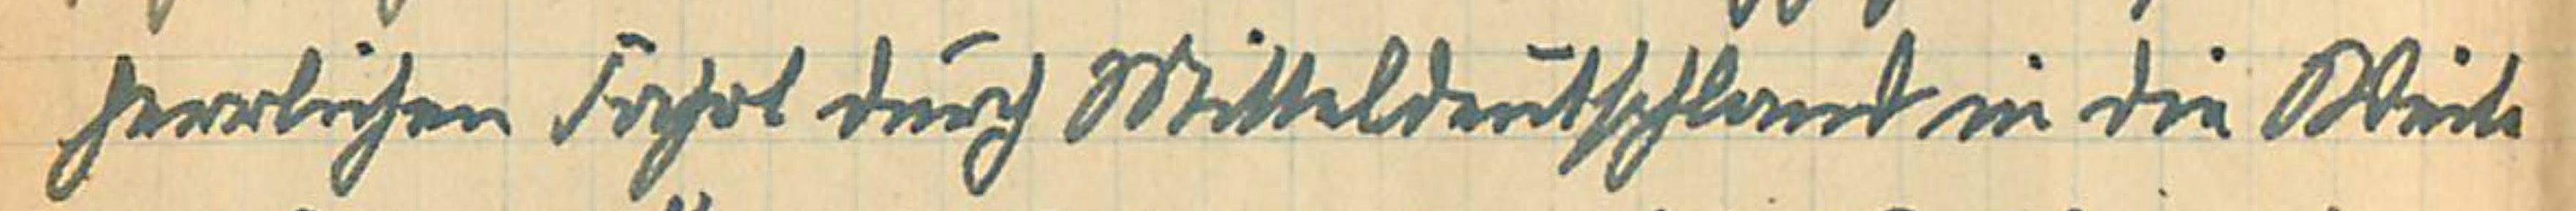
herrlichen Fahrt durch Mitteldeutschland in die Weite
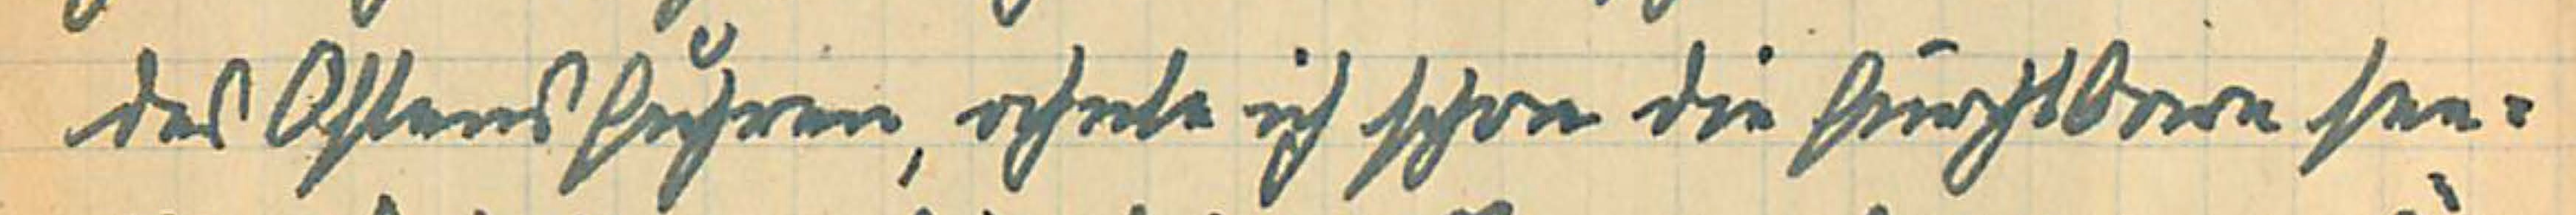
des Ostens fuhren. ahnte ich schon die furchtbare see-
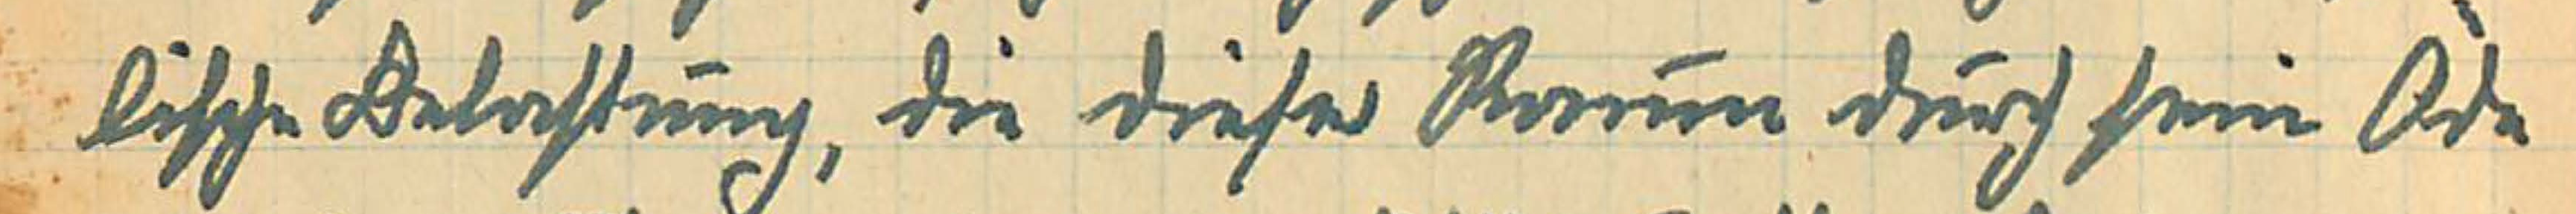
lische Belastung, die dieser Raum durch sein Öde
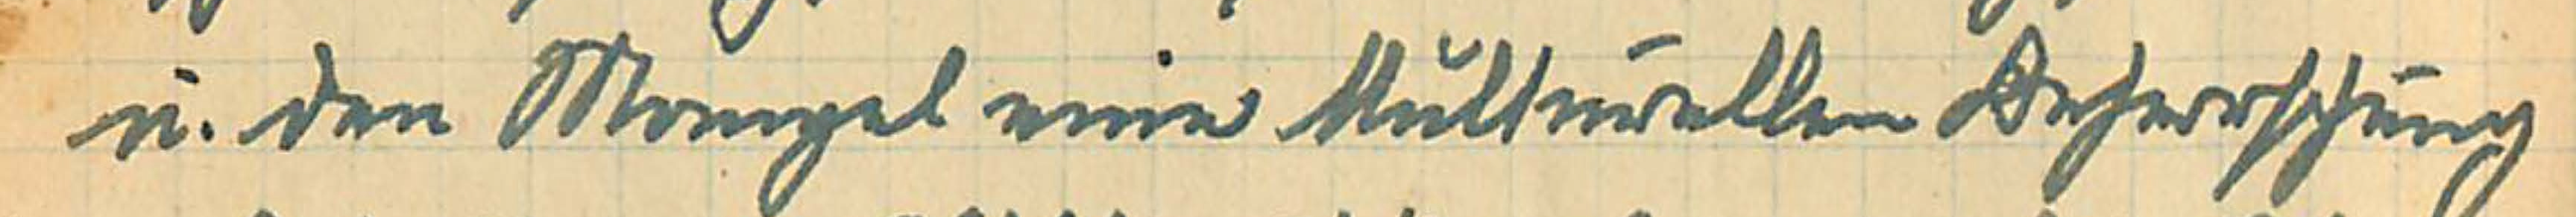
u. den Mangel einer kulturellen Beherrschung
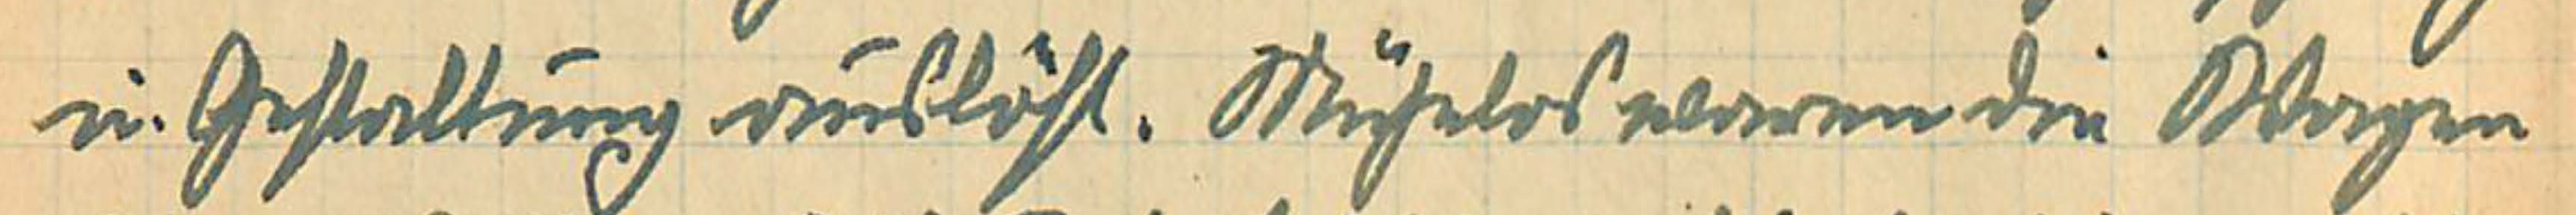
u. Gestaltung auslöst. Mühelos waren die Wagen
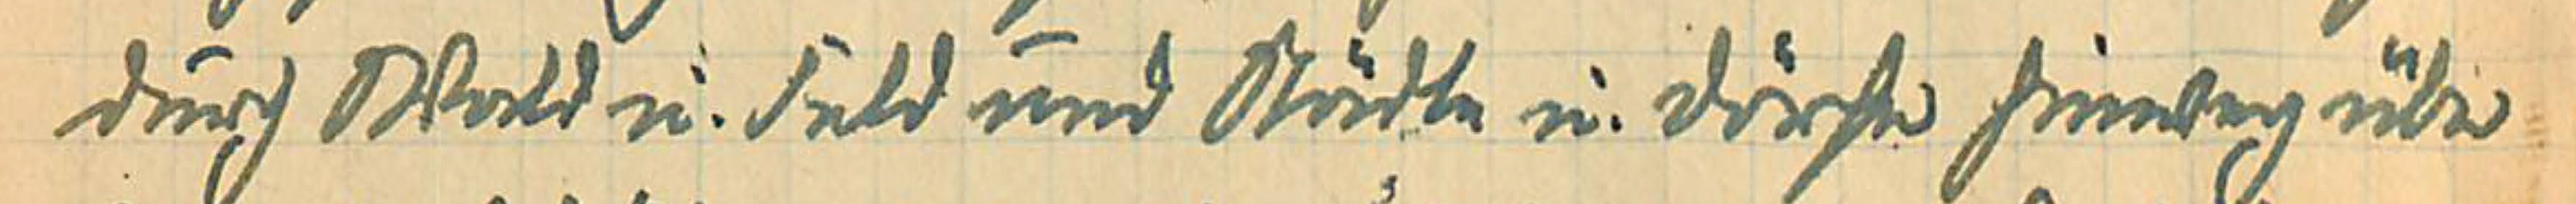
durch Wald u. Feld und Städte u. Dörfer hinweg über
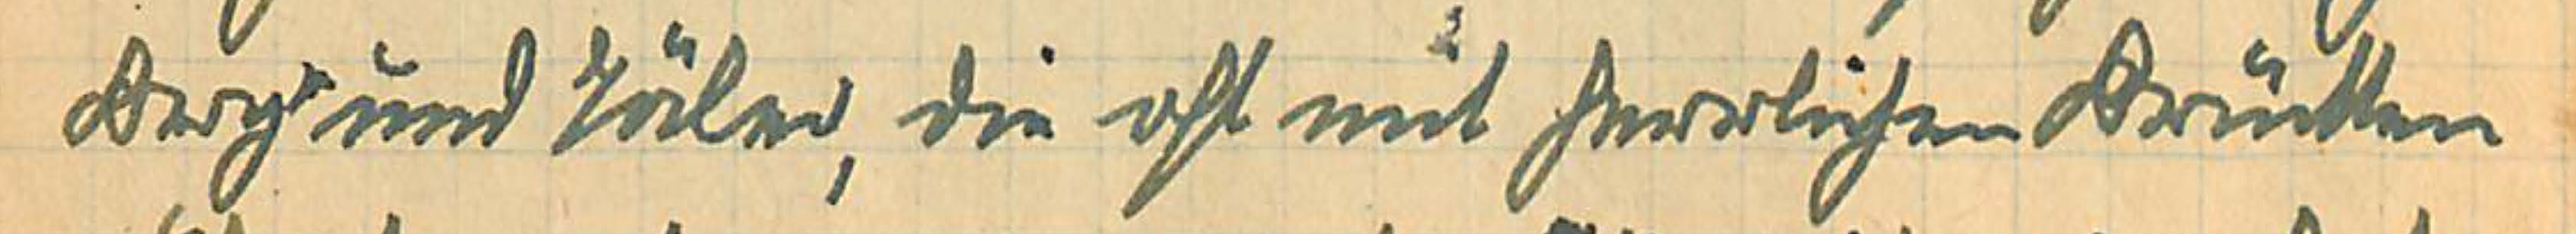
Berge und Täler, die oft mir herrlichen Brücken
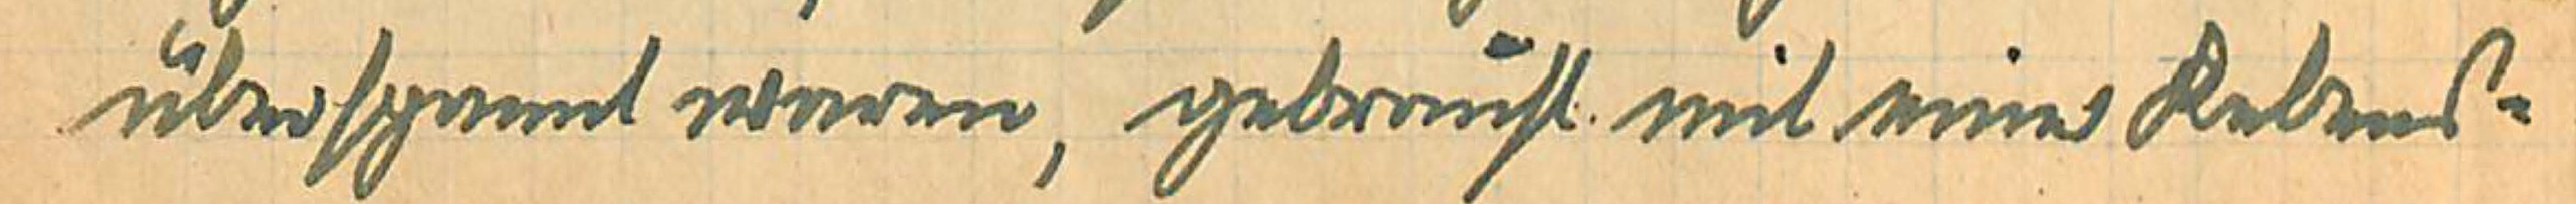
überspannt waren, gebraust mit einer Lebens-
